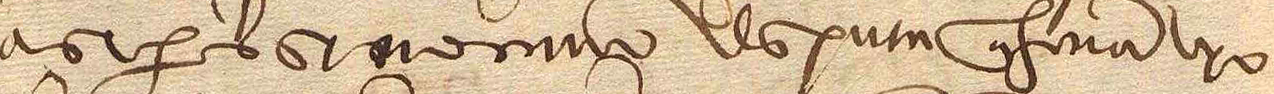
asy ꝑ ēsyno como desputa q̄ ho nā vyo
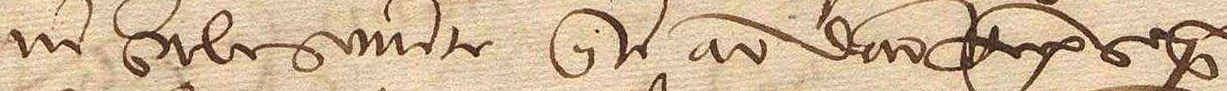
nē sabe somēte q̄ tem ao dit̄o Reo p̄so p̄o
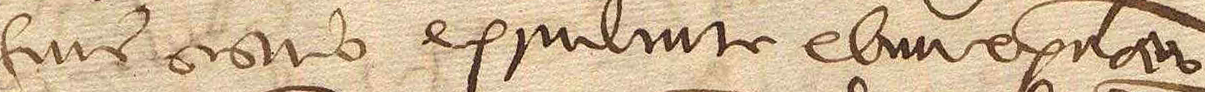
homē sesudo e prudente e bom xpãaoo
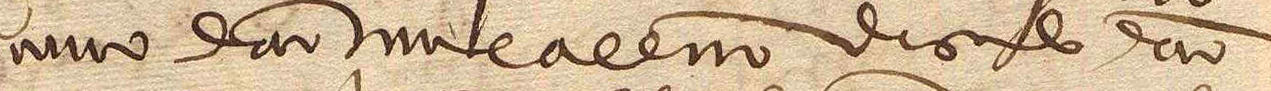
como dit̄o tem e all nō dise do dit̄o
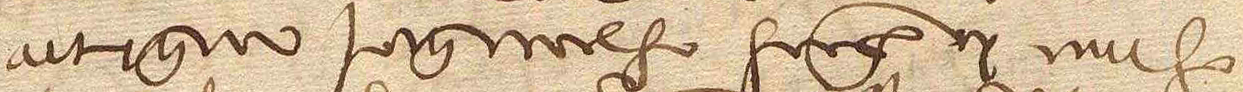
artyguo Jorge coelho ho esp̄vy com ho
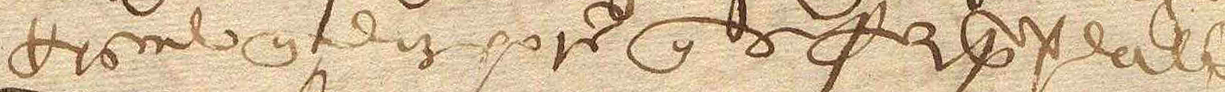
Ryscado q̄ diz porē q̄ se fez p̄o ꝟdade
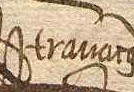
trauacꝯ
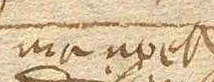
manoell
